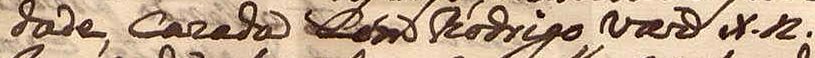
dade, cazada Com Rodrigo Vaz x. n.
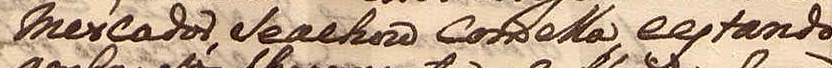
mercador, se achou com ella, e estando
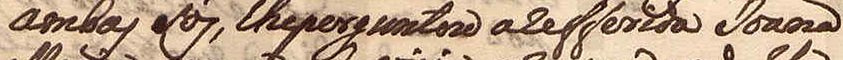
ambas sós, lhe perguntou a Refferida Ioana
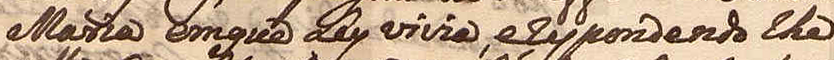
Maria em que Ley vivia, e Respondendo lhe
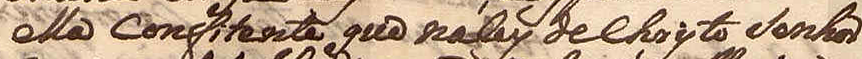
ella confitente que na ley de Christo senhor
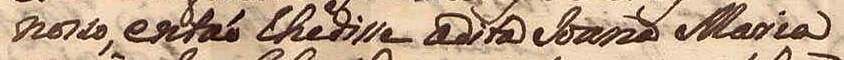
nosso, entaõ lhe disse a dita Ioana Maria
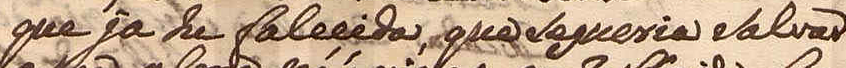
que ja he falecida, que se queria salvar
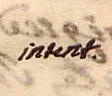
intent.
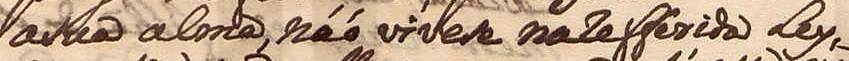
a sua alma, naõ vivese na Refferida Ley,
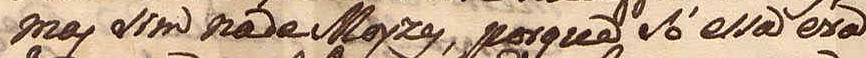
mas sim na de Moyzes, porque só essa era
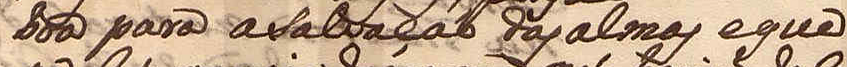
boa para a salvaçaõ das almas e que
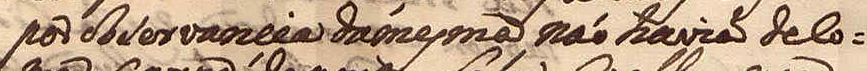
por observancia da mesma naõ haviaõ de Co
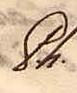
Ph.
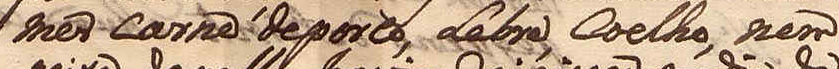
mer carne de porco, Lebre, Coelho, nem
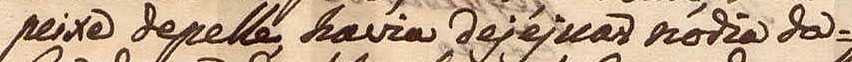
peixe de pelle, havia de jejuar no dia da
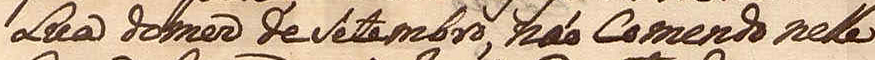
Lua do mez de setembro, naõ comendo nelle
